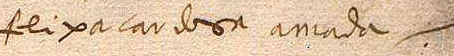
felipa cardosa amada
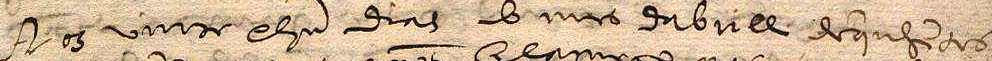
Aos vinte e hū dias do mes dabrill de q̄nhētos
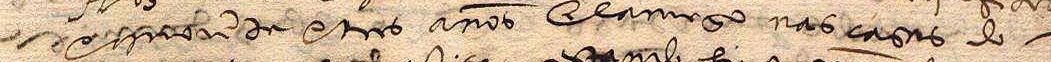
e quorēta e tres an̄os ē lamego nas casas do /
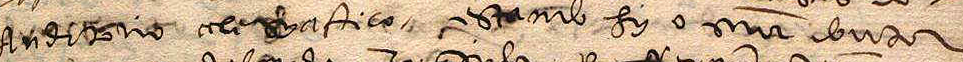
Auditorio eclesyastico / estando hy o sn̄or doutor
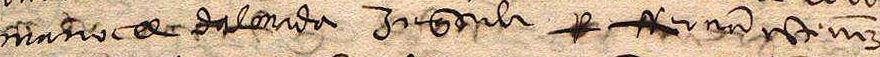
manoell dalmada Jnq̄sidor ꝑ ffernā esteuez
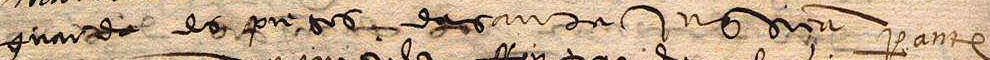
guarda dos presos da santa Jnq̄siçā ꝑante
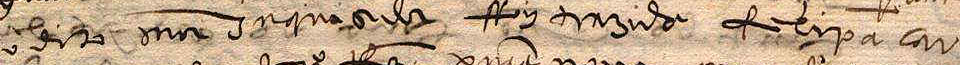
o dito s̄nor Jnquisidor ffoy trazida felipa Car
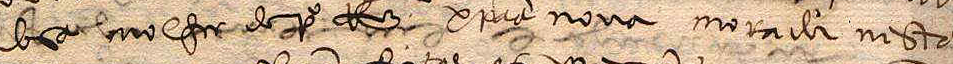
dosa molher de ꝑo Rōz xpāa noua morador nesta
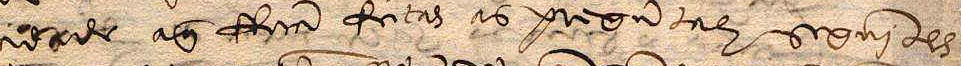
çidade a q̄ fforā feitas as pregūtas seguj̄tes
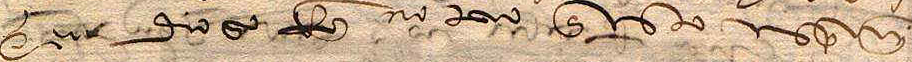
e eu diogo R̄oz notro q̄ esto esp̄evy
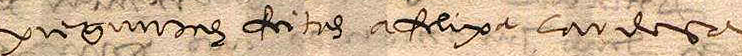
preguntas feitas a felipa Cardosa
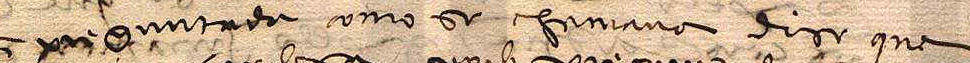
item preguntada como se chamaua dise que
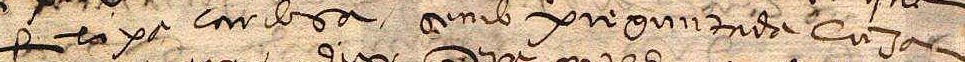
felipa cardosa / sendo preguntada CuJa
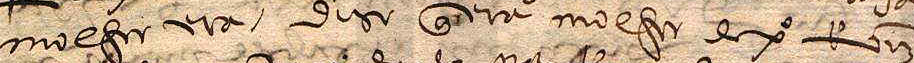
molher era / dise q̄ era molher de po Roīz
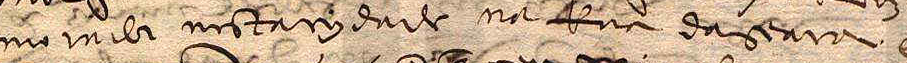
morador nesta cydade na Rua da seara e
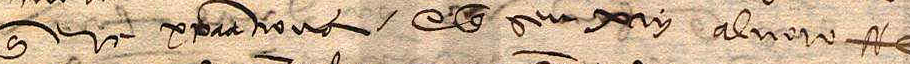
q̄ era xp̄aa noua / e q̄ seu pay aluoro ffe
